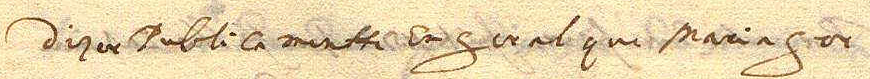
dizer Publicamente Em geral que Maria gor
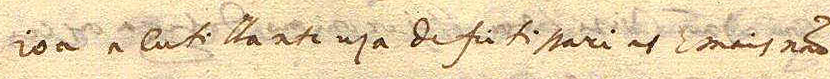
ioa a cutillante uza de feitissarias E mais não
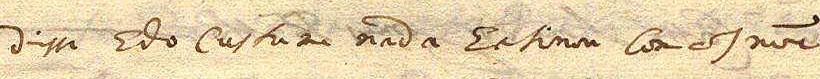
disse E do custume nada E asinou com o Snōr
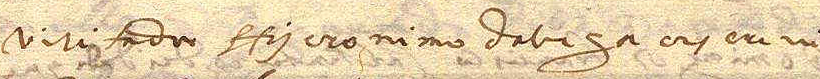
visitador Hyeronimo da vega o escreui
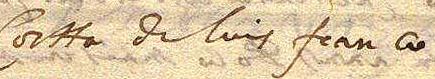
Costta de luis franco
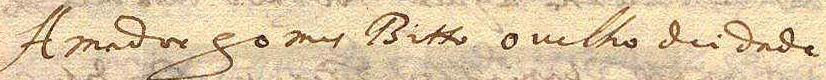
Amador gomes Bitto o uelho de idade
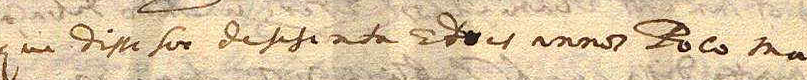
que disse ser de sesenta E dois annos Poco ma
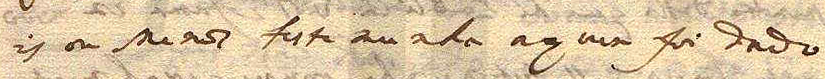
is ou menos testemunha a quem foi dado
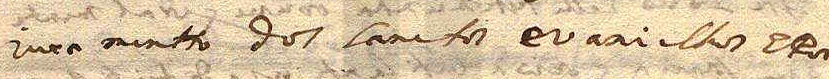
iuramentto dos sanctos evanielhos E Per
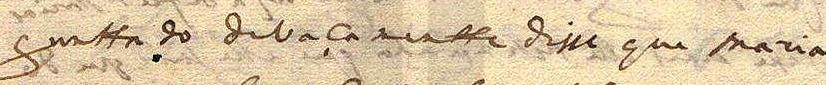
gunttado devaçamentte disse que maria
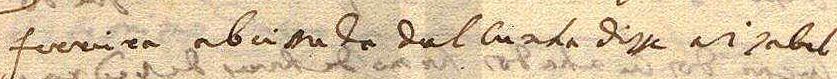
ferreira a beissuda dalcunha disse a izabel
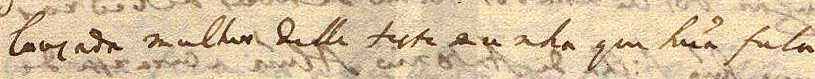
louzada mulher delle testemunha que huā fula
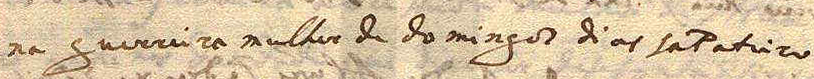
na guerreira mulher de domingos dias saPateiro
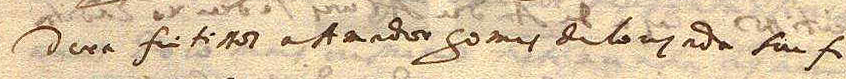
dera feitissos a Amador gomes de louzada seu fi
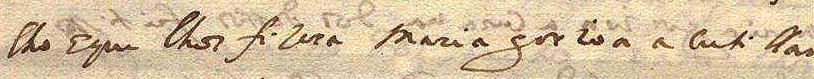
lho E que lhos fizera Maria gorioa a cutillan
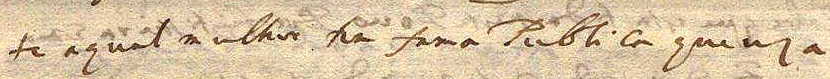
te a qual mulher ha fama Publica que uza
